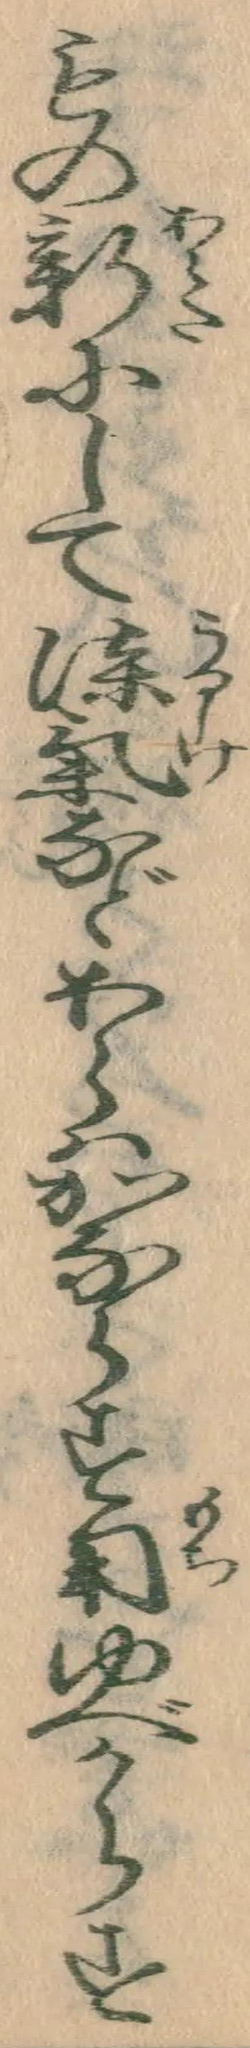もの新にして漆気などあらはかならす用ゆべからす
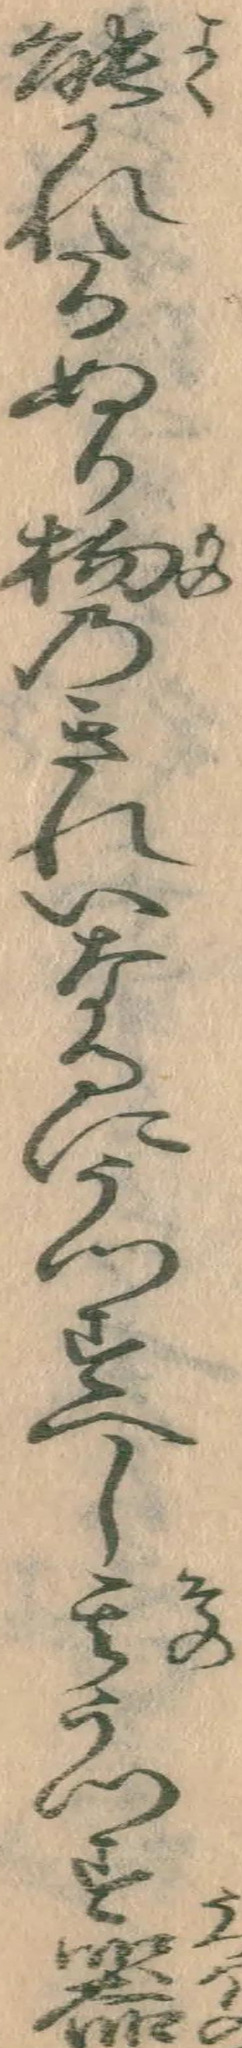能かれたるぬり物のきれいなるにうつすへし其うつす器
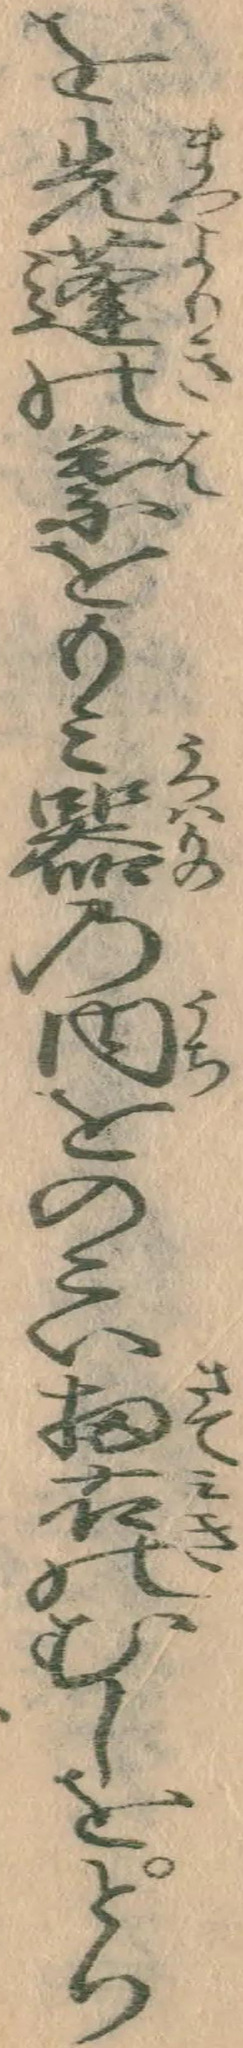を先蓬の葉をもみ器の内をのこい扨右のむしを。とり
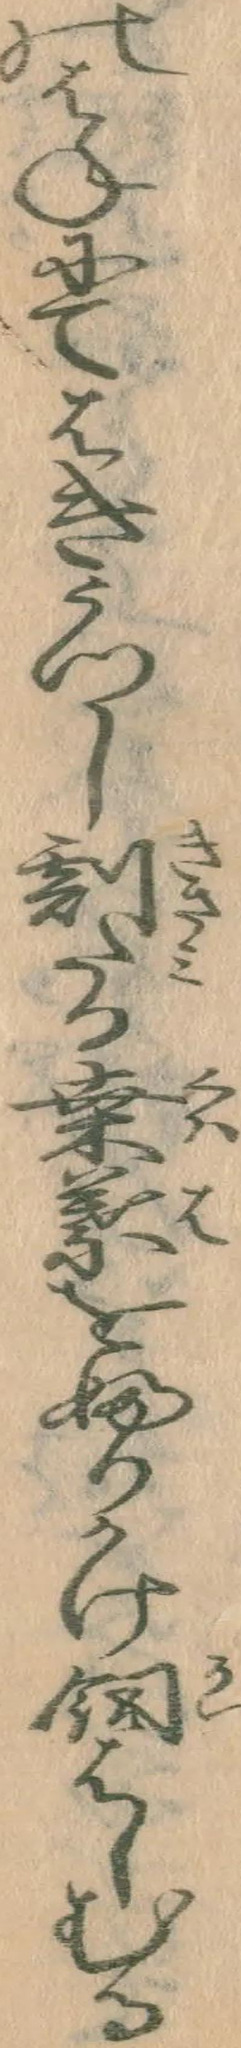のはねにてはきうつし刻たる桑葉をふりかけ飼はしむる
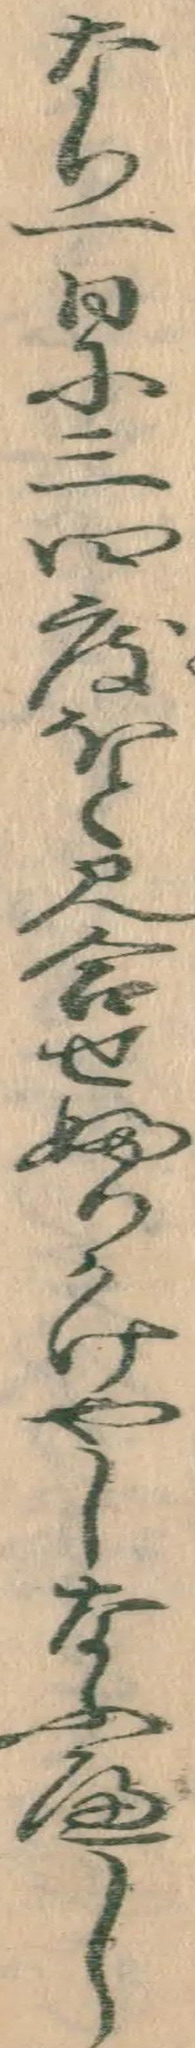なり一日に三四度ほと見合せふりかけやしなふべし
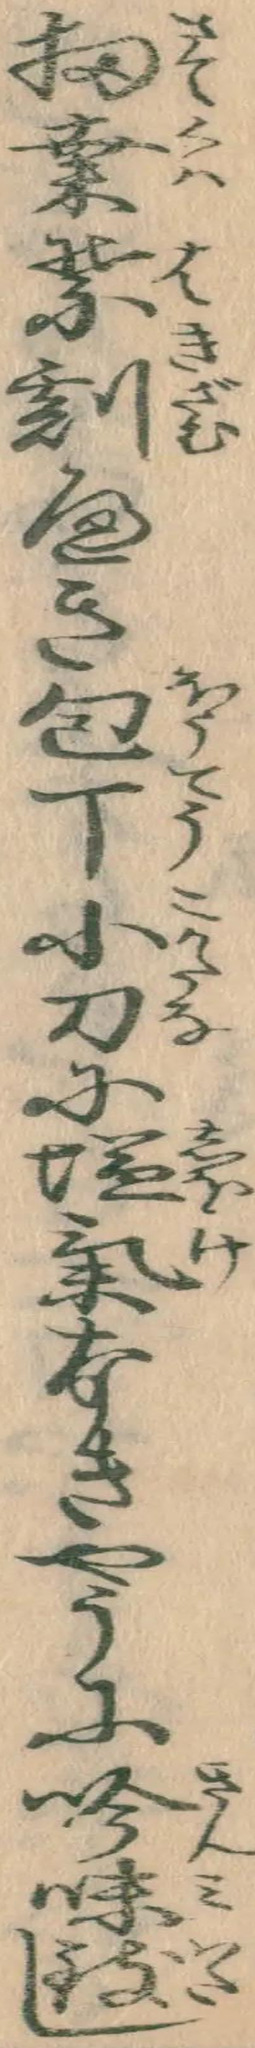扨桑葉刻へき包丁小刀に塩気なきやうに吟味致し
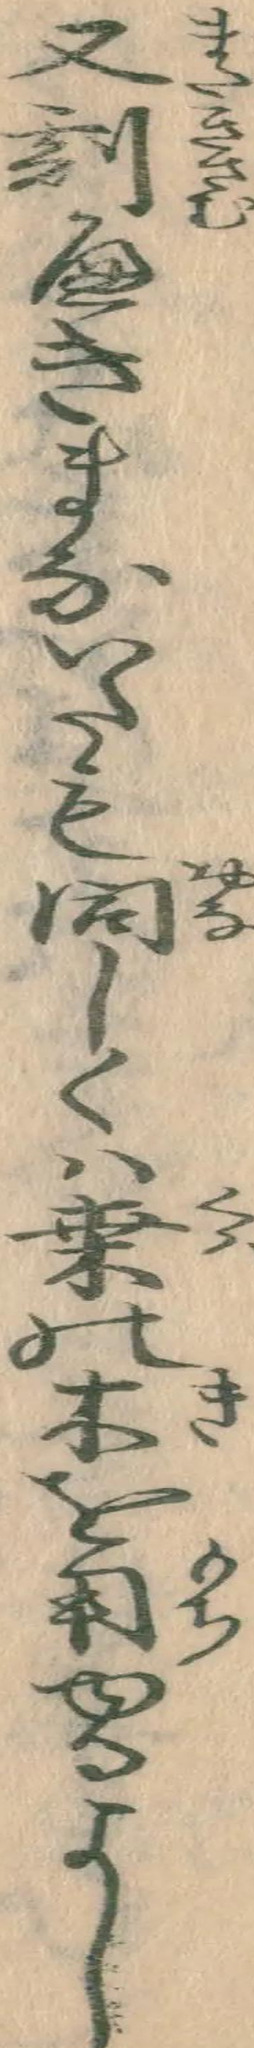又刻へきまないたも同しくは桑の木を用ゆるよし
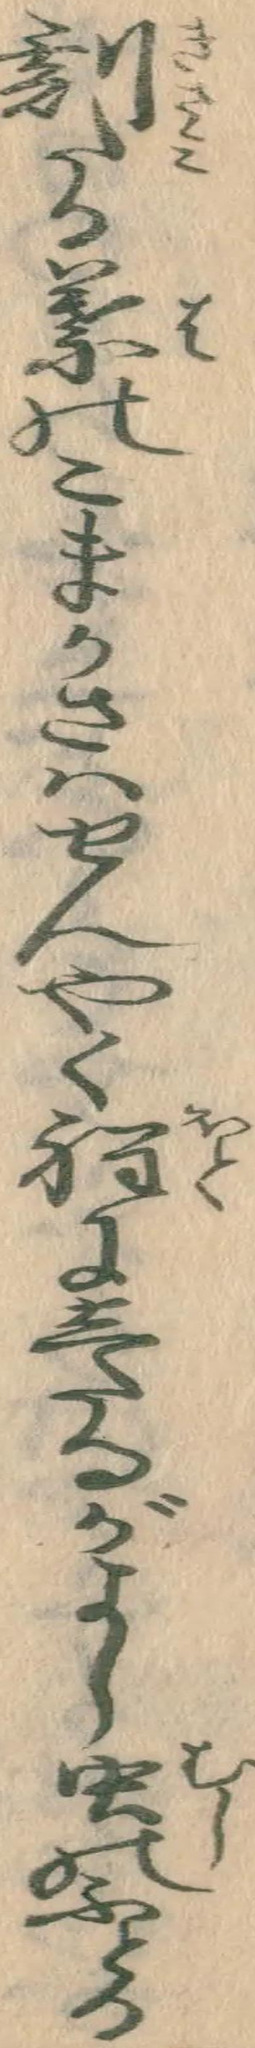刻たる葉のこまかさはせんやく程にしたるがよし虫のふとり
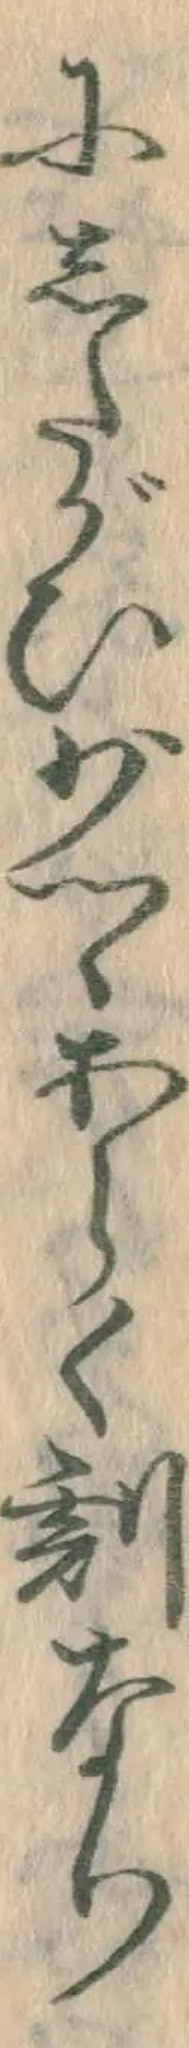にしたがひ少つゝあらく刻なり
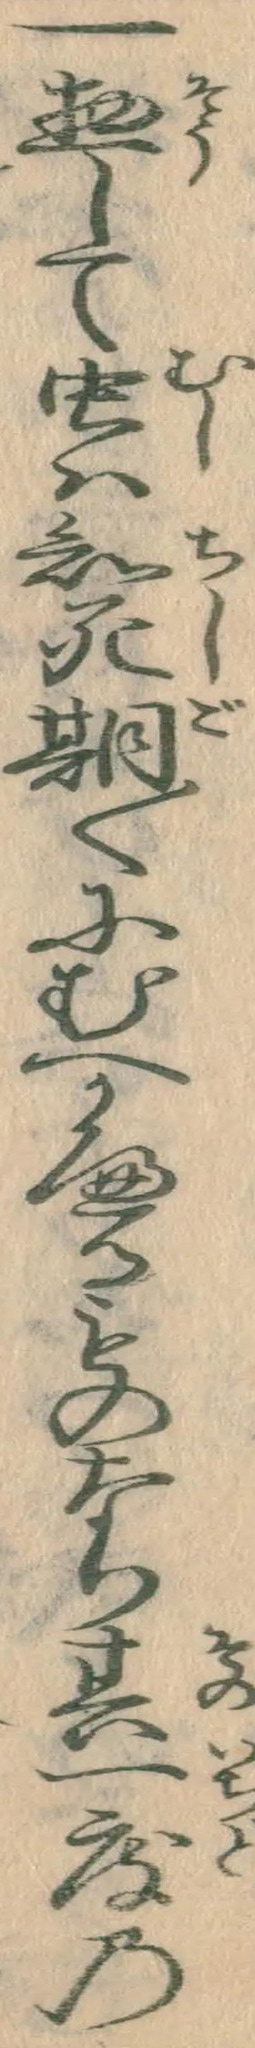一惣して虫は知死期〳〵にむへかへるものなり其一度の
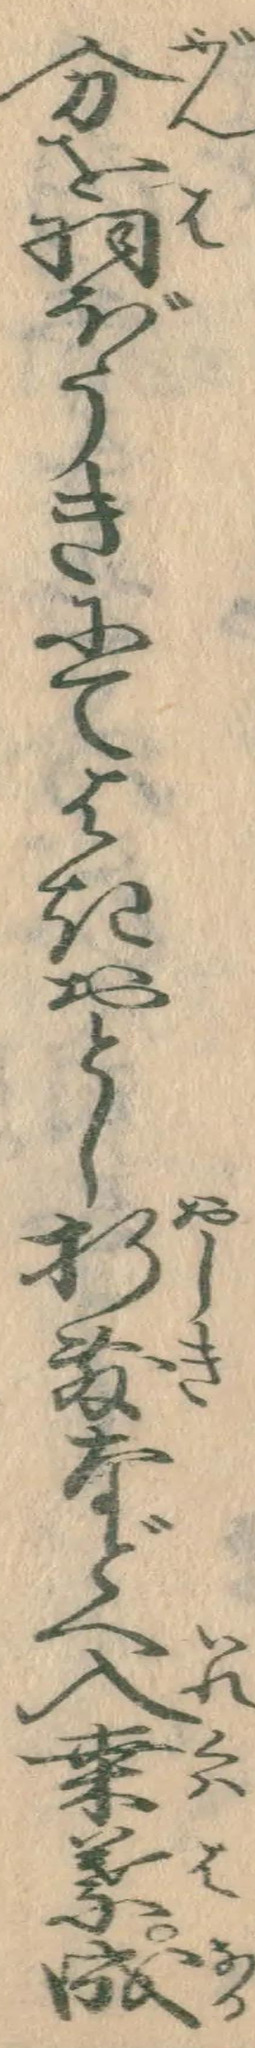分を羽ぼうきにてはきおとし折敷などへ入桑葉。成
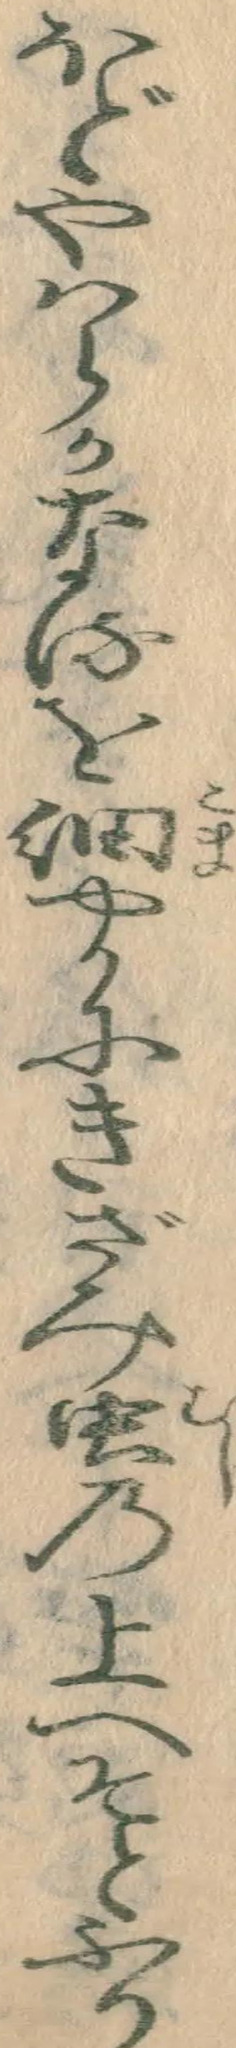ほどやはらかなるを細やかにきざみ虫の上へそとふり
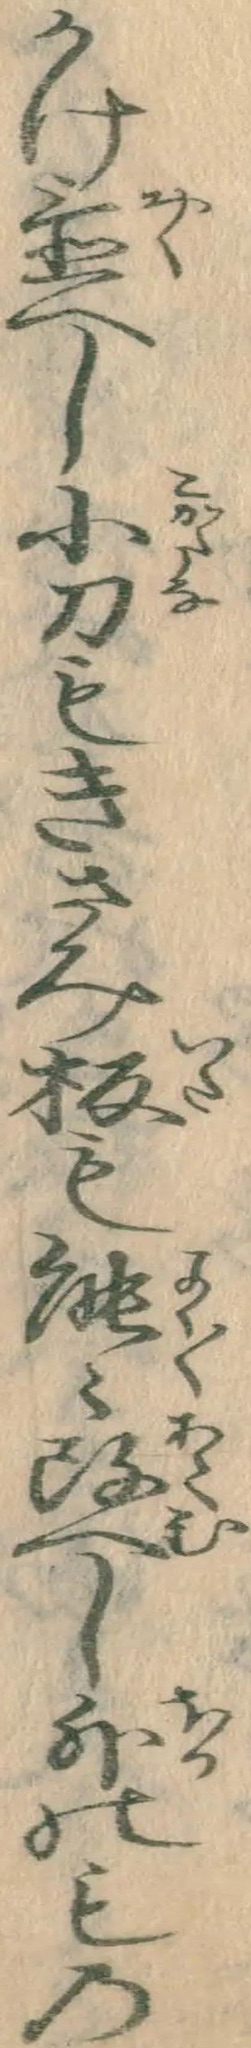かけ置へし小刀もきさみ板も能々改へし外のもの
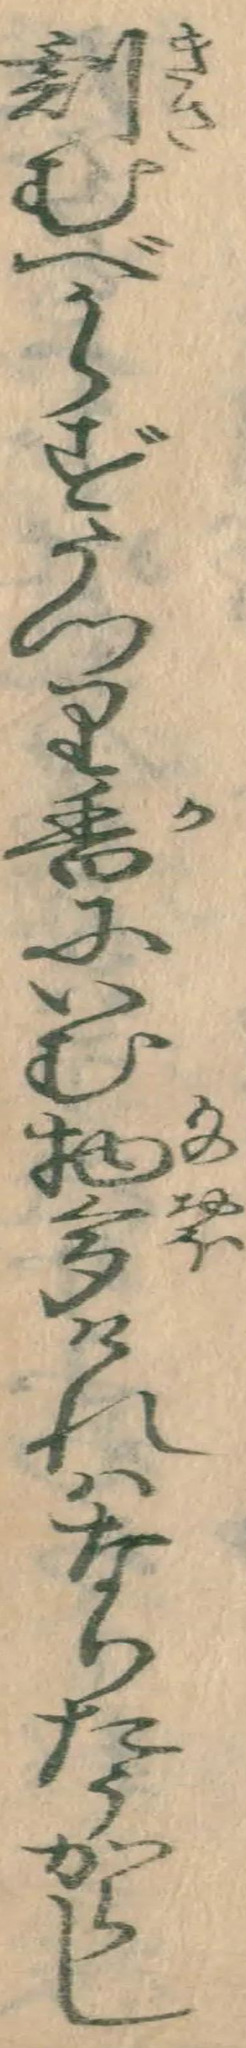刻むべからずうつり香にいむ物多けれはなりたうからし

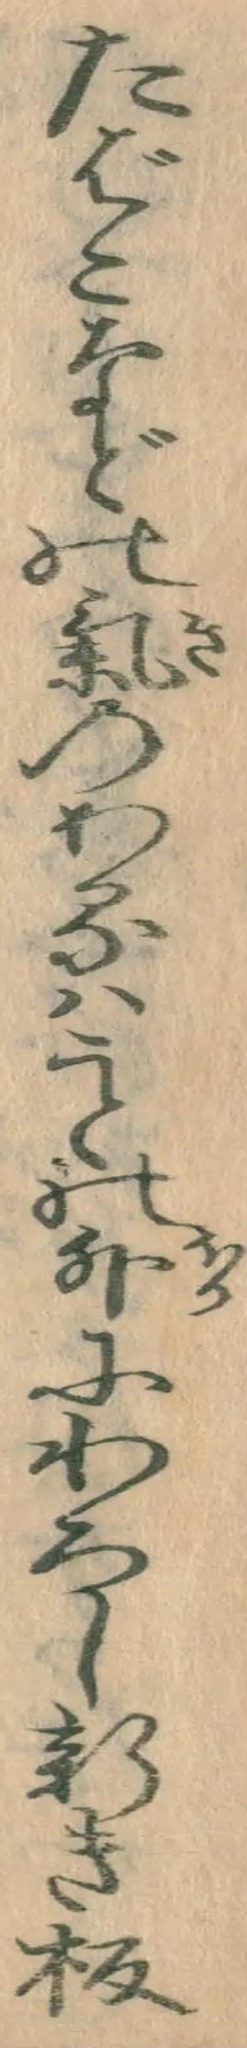たばこなどの気のあるはことの外にわろし新き板
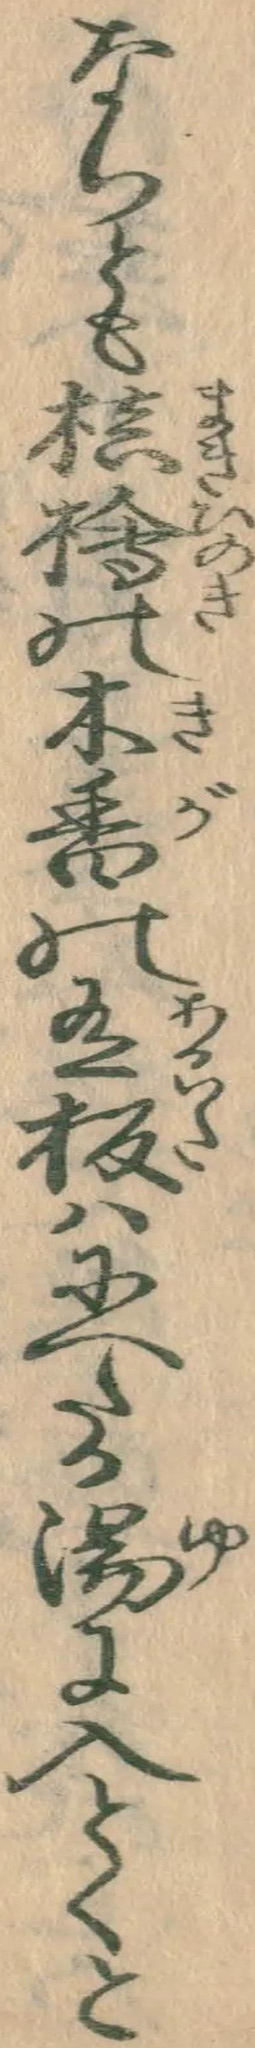なりとも槇檜の木香の有板はにへたる湯に入とくと
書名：蚕飼養法記
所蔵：国立国会図書館 National Diet Library, JAPAN
